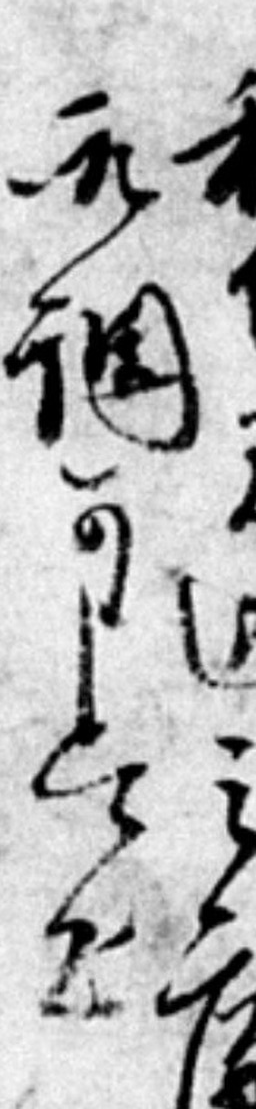取調可申上候以上
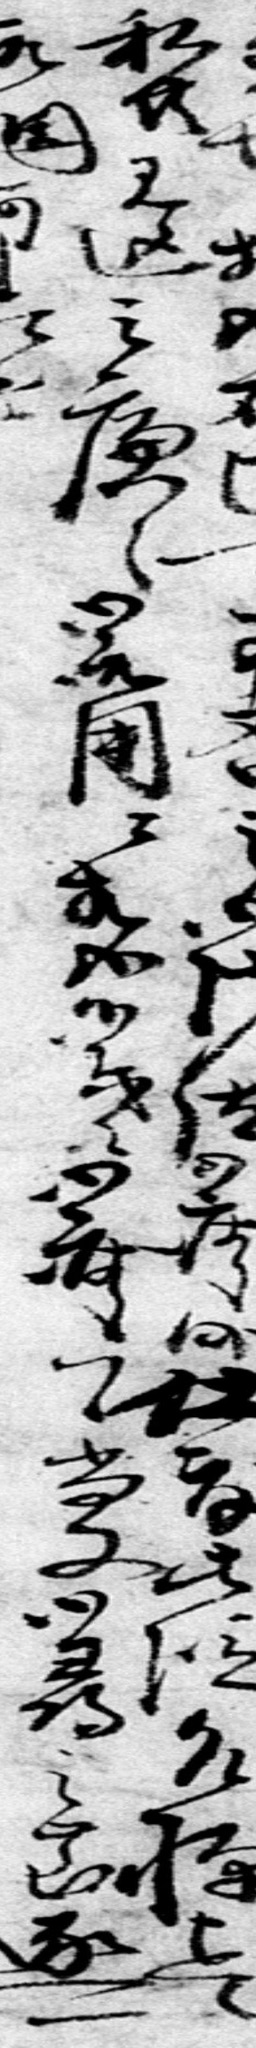私共見込之廉々御取用に相成候義に御座候はゝ尚又御尋之節逐一
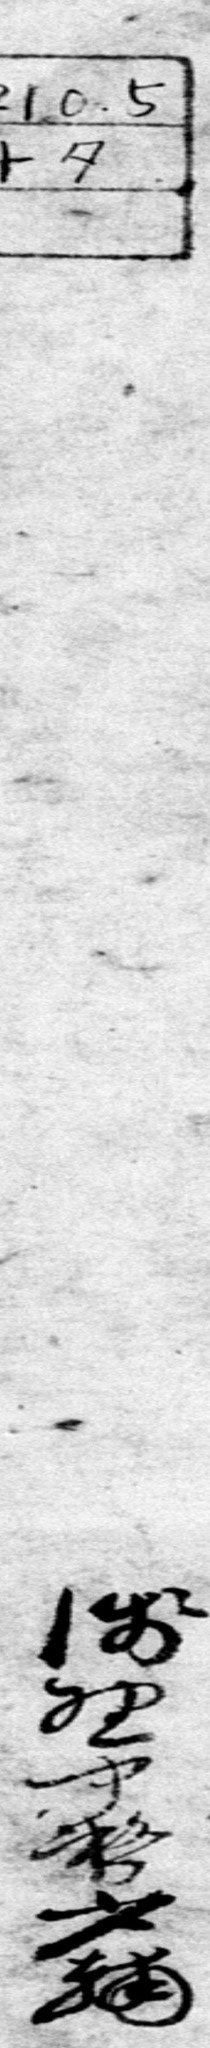浅野中務少輔
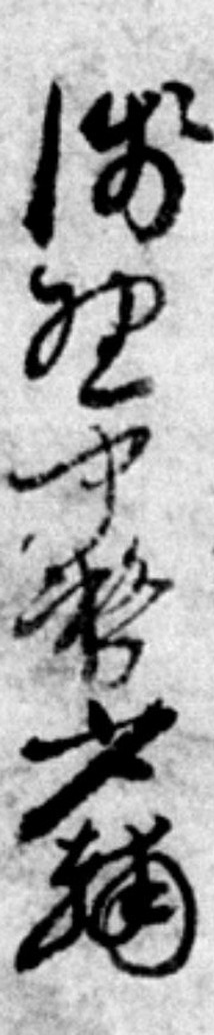浅野中務少輔
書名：浦賀御奉行見込秘書写
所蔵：徳島県立図書館
